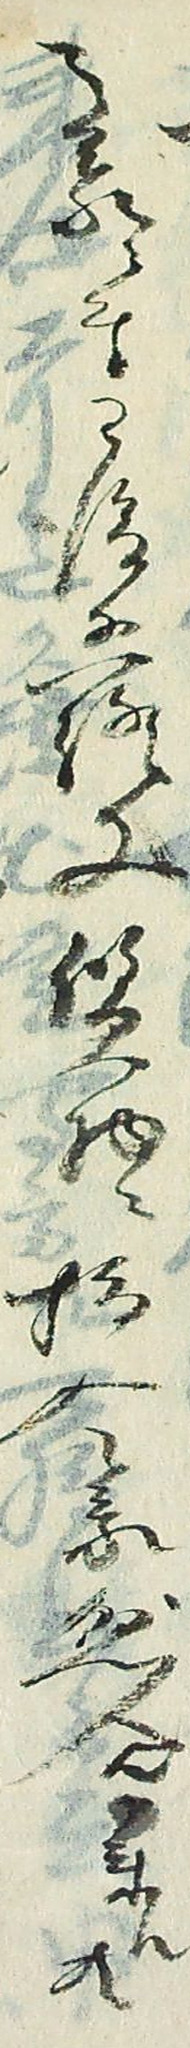之義に付已後右證文質物に指入候義懸合に来る共
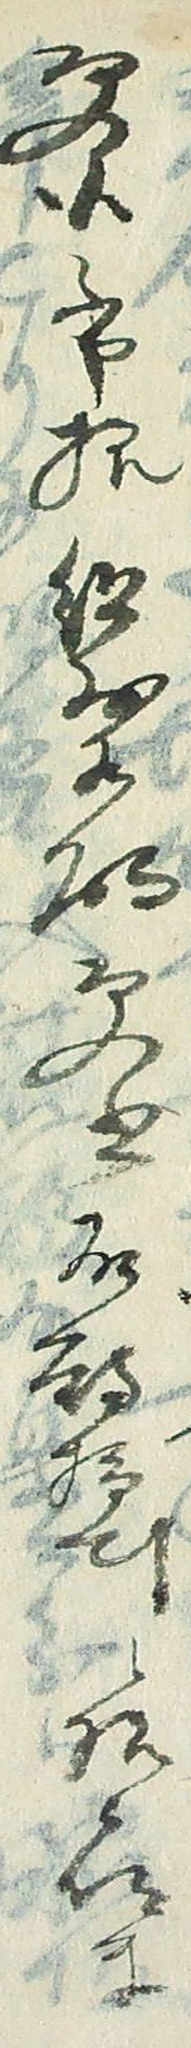受取不申様組村相触受書取都指出し候様被仰付
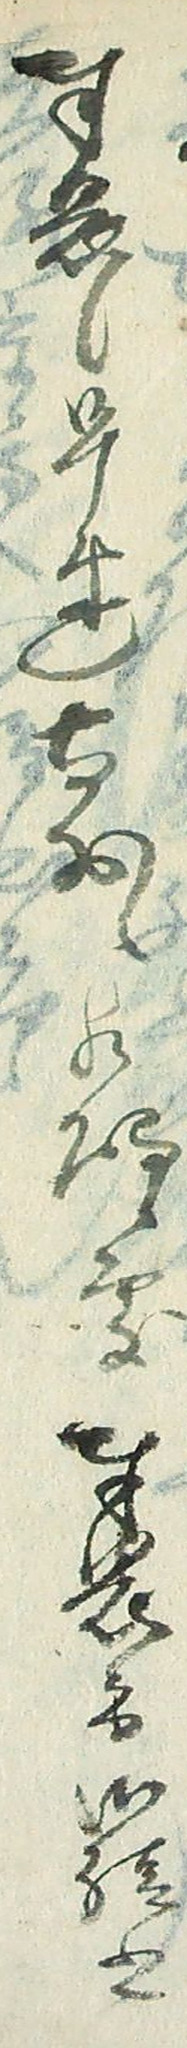奉畏候早速与村々相触候処奉畏旨御請書
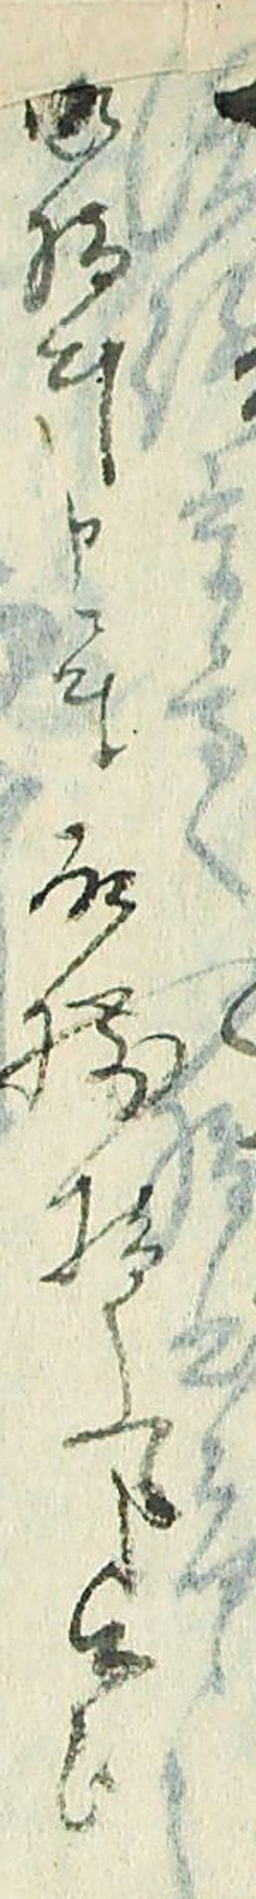御指出し申に付取揃指上申候以上
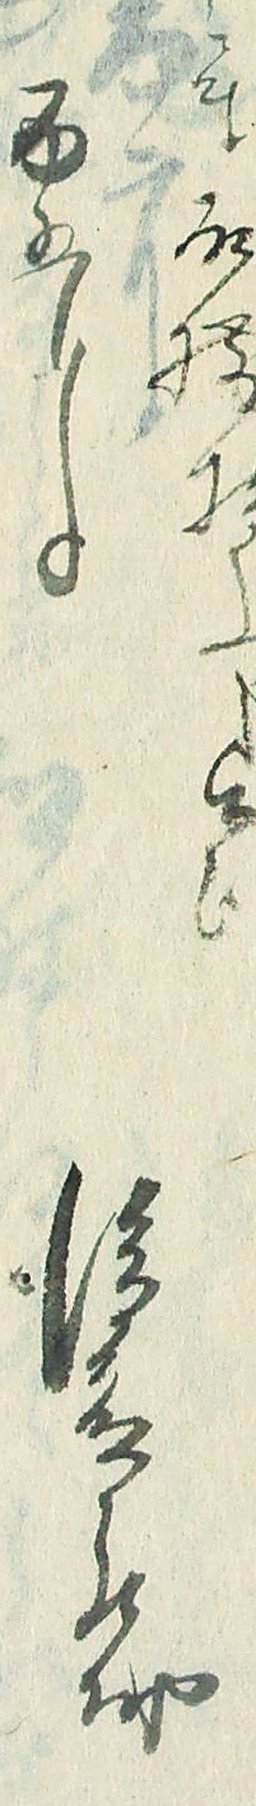酉五月後藤庄助
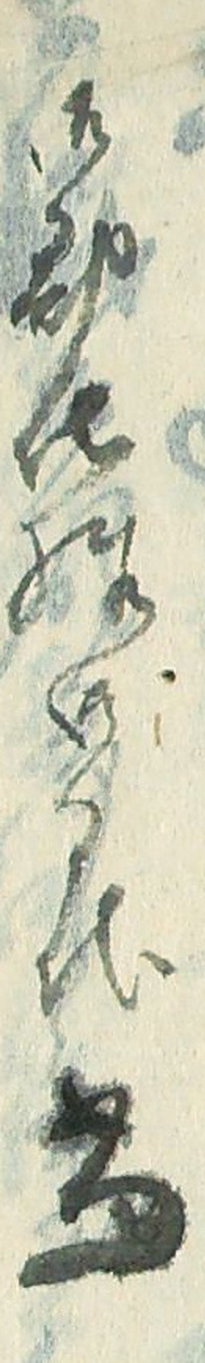御郡代様御手代当

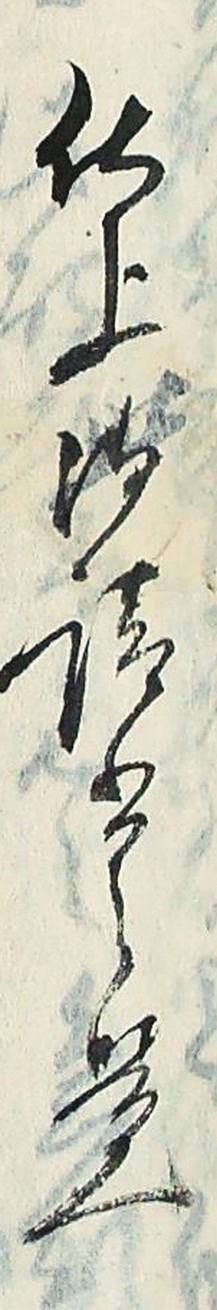仕上御請書之覚
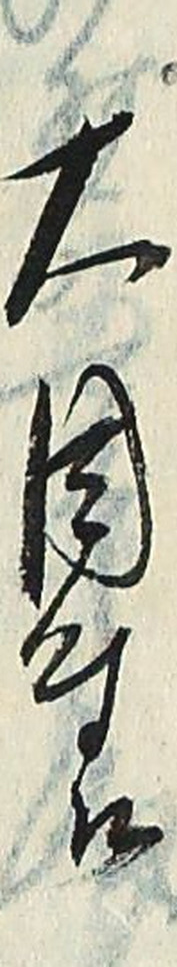大目付江
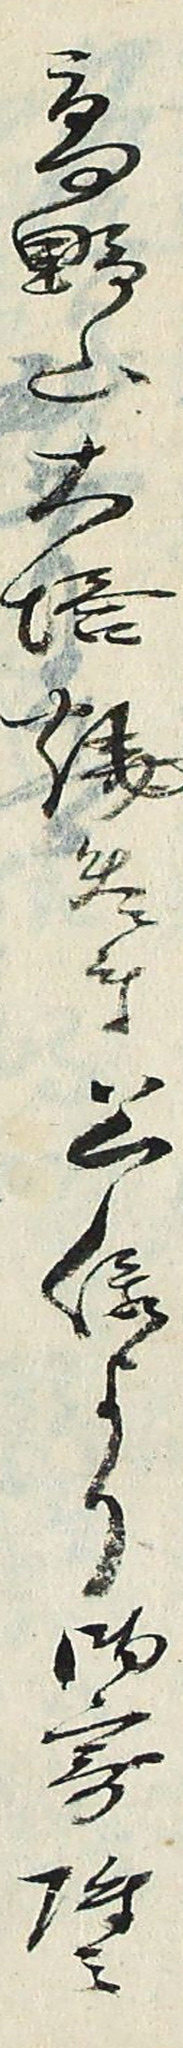高野山大塔焼失に付公儀より御寄附之
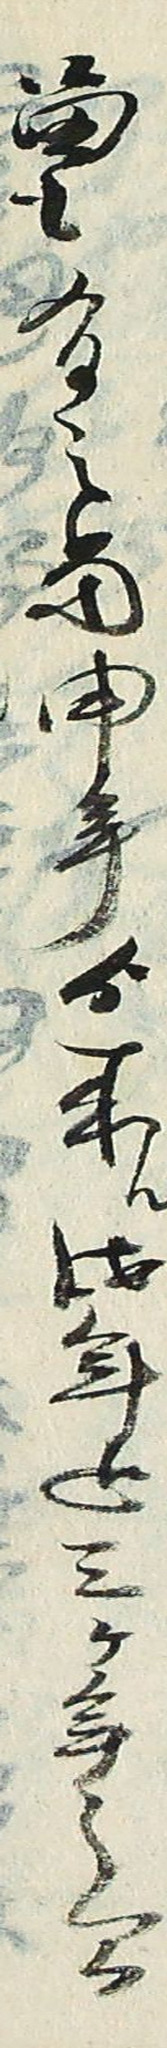当も有之当申年ゟ来る戌年迄三ヶ年之間
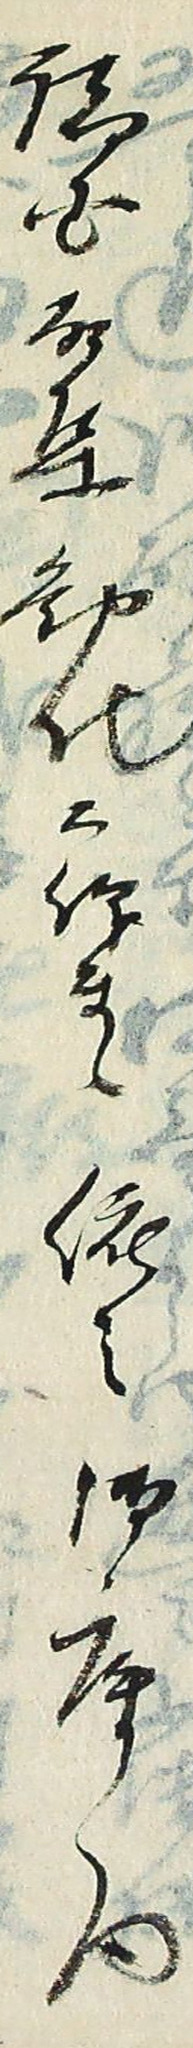諸国取集勧化被仰付候依之御府内
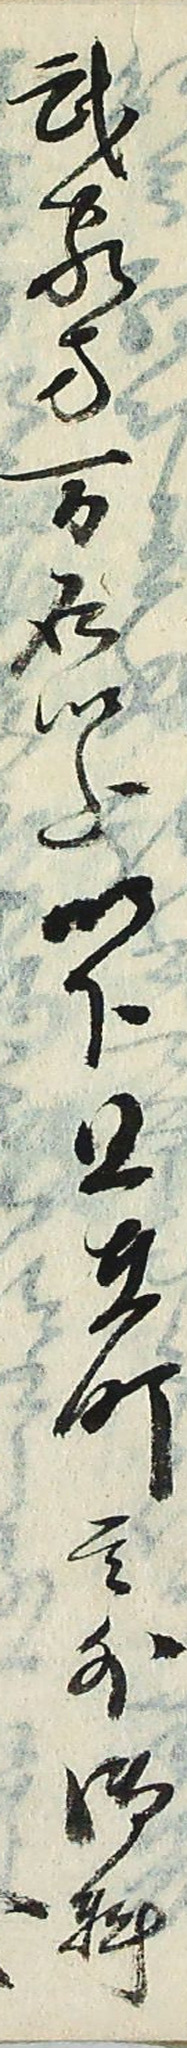武家方万石以上以下且在町其外御料
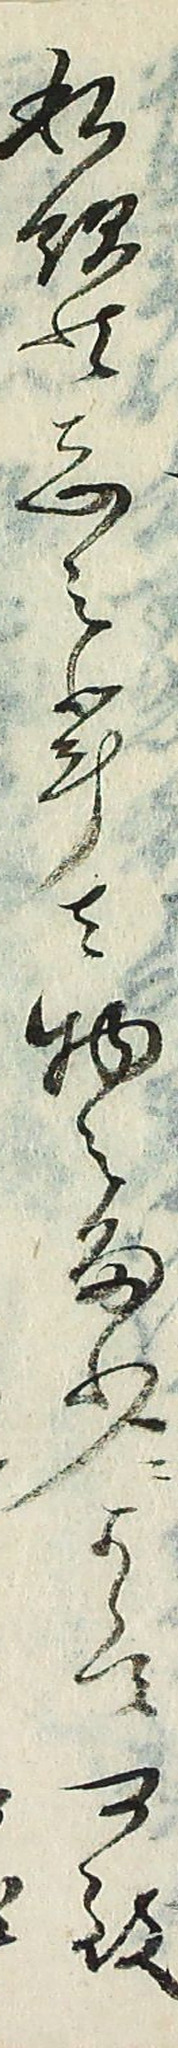私領共志之輩者物の多少によらす可致
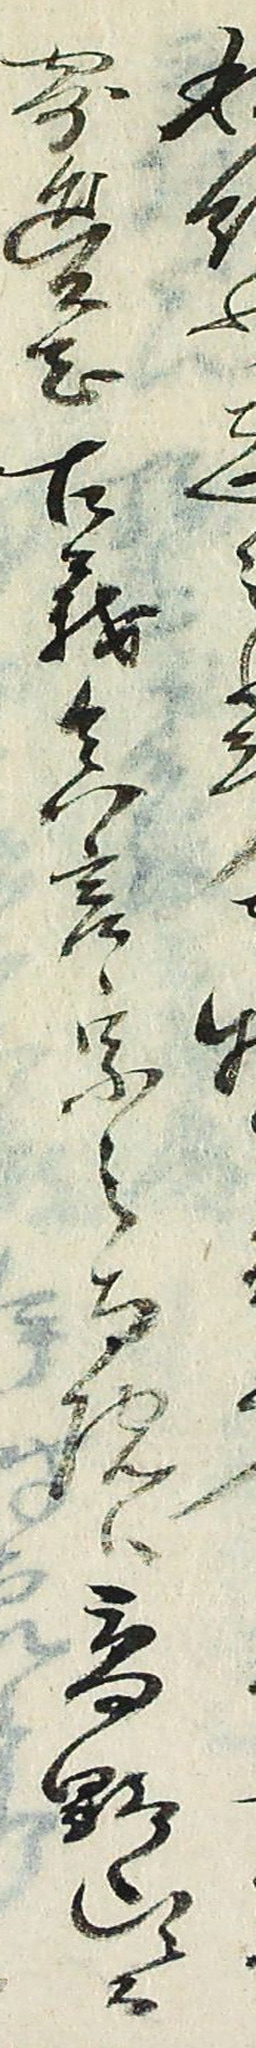寄進候尤古義真言宗之寺院は高野山に而
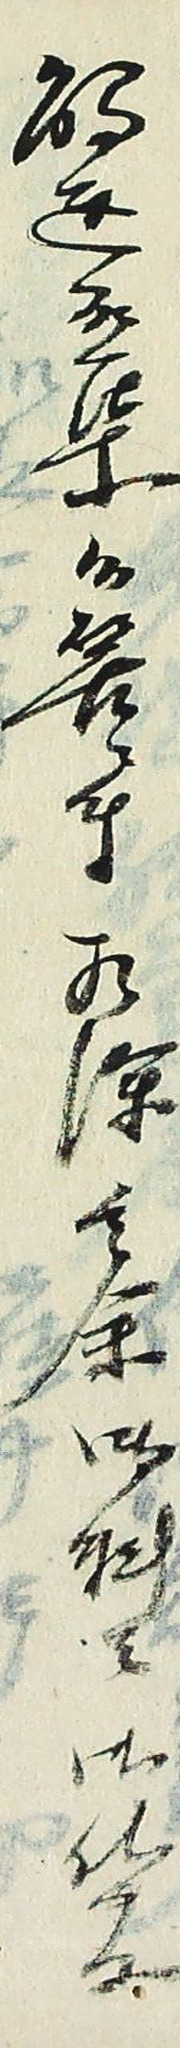触達取集候筈に付相除其余御料者御代官
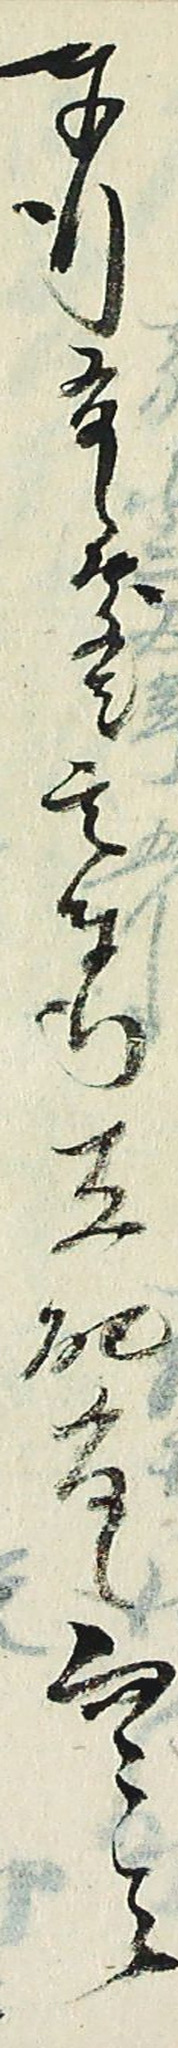奉行有之処者其奉行支配有之向々者
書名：諸御用御□受書控
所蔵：鳴門教育大学 Naruto University of Education
